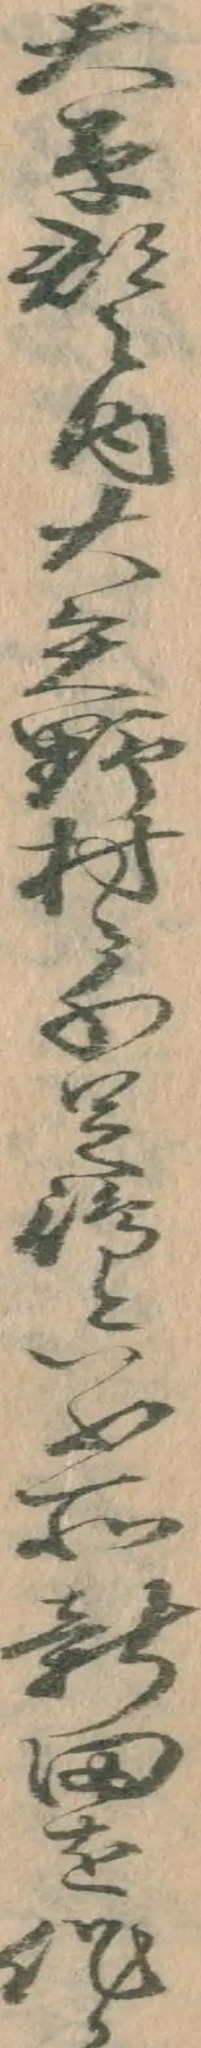天草郡之内大矢野村に千足島といふ所新田を作り
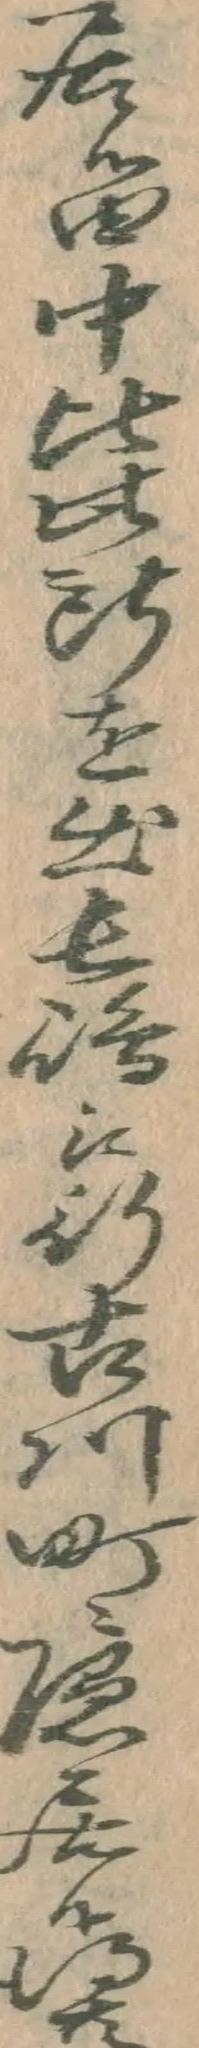居候由中比此所を出長崎え行古川町に隠居候得共
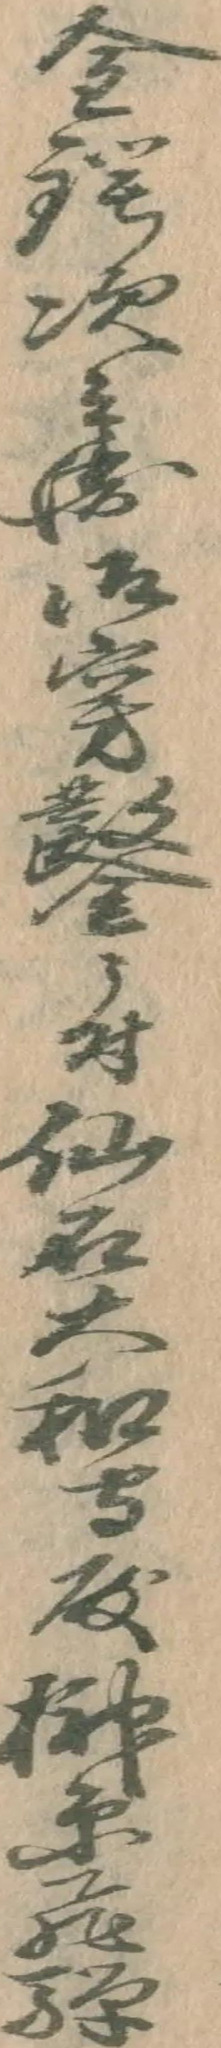金鍔次兵衛御穿鑿に付仙石大和守殿榊原飛騨
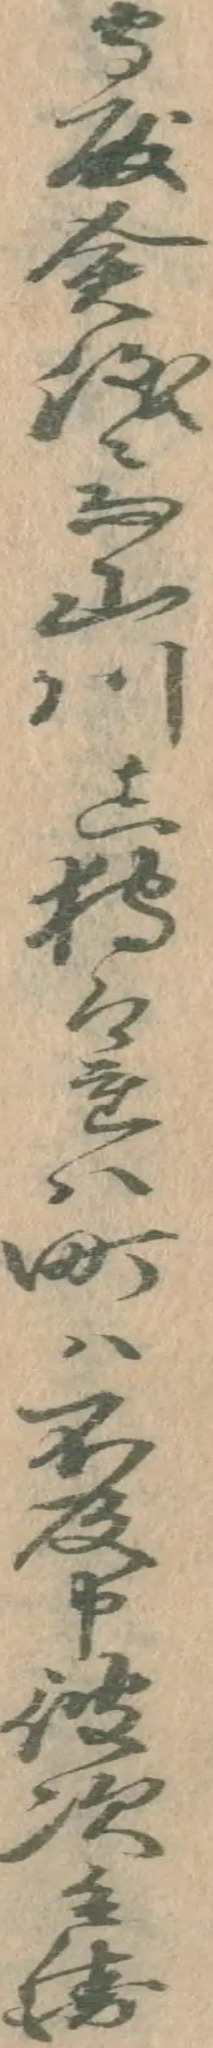守殿僉儀に而山川迄狩けれは町は不及申彼次兵衛
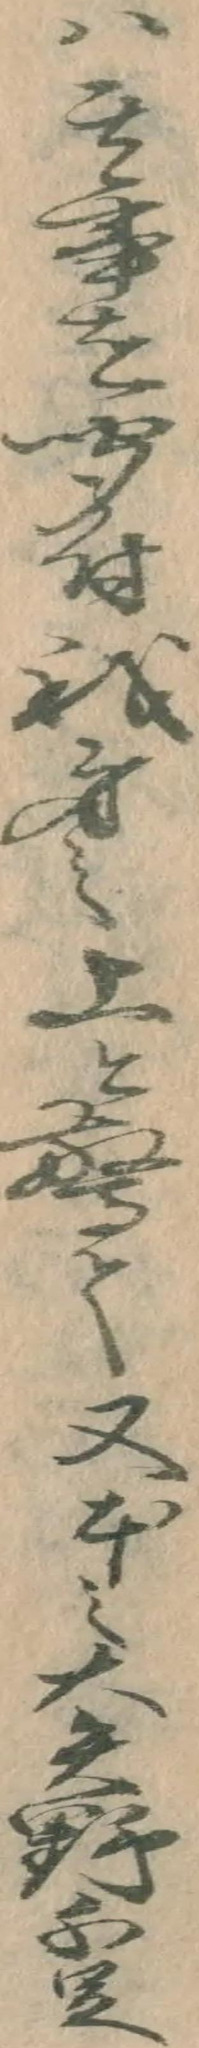は其事を聞付我身之上と驚て又本之大矢野千足
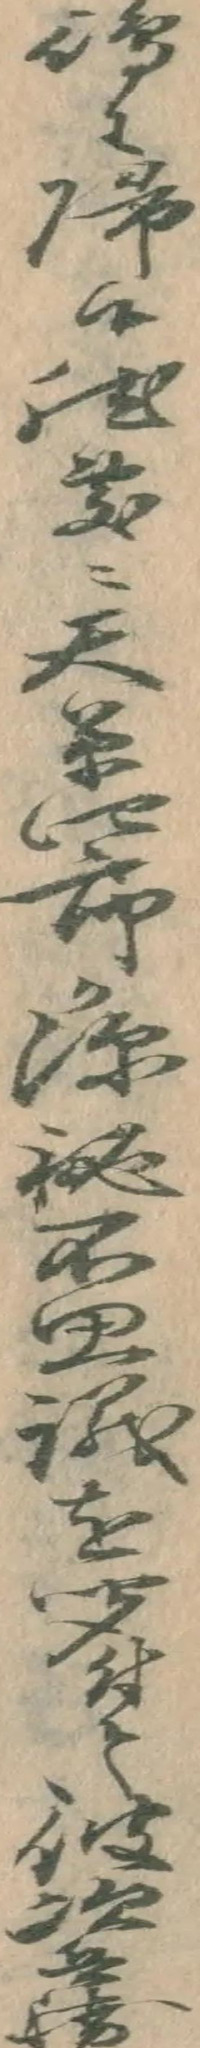島に帰候然処に天草四郎か深秘不思議を聞付て彼次兵衛
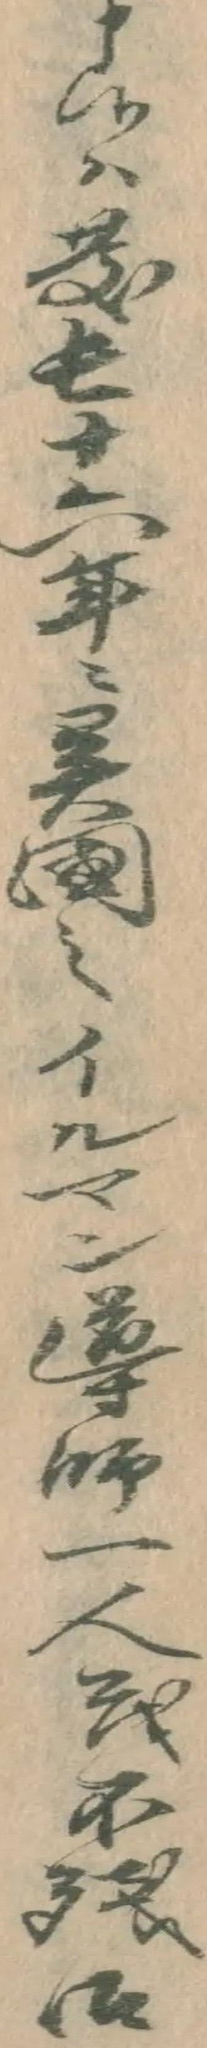申候は慶長十六年に異国のイルマン導師一人も不残御

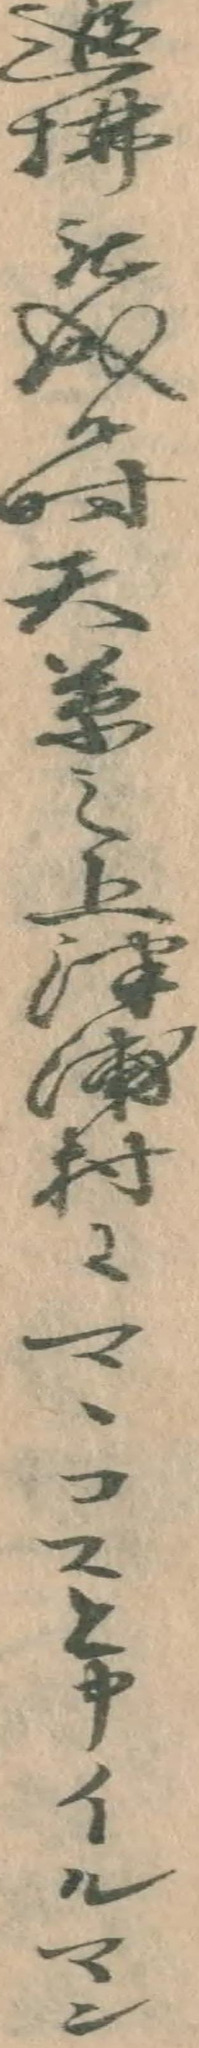追払被成候時天草之上津浦村にマヽコスと申イルマン
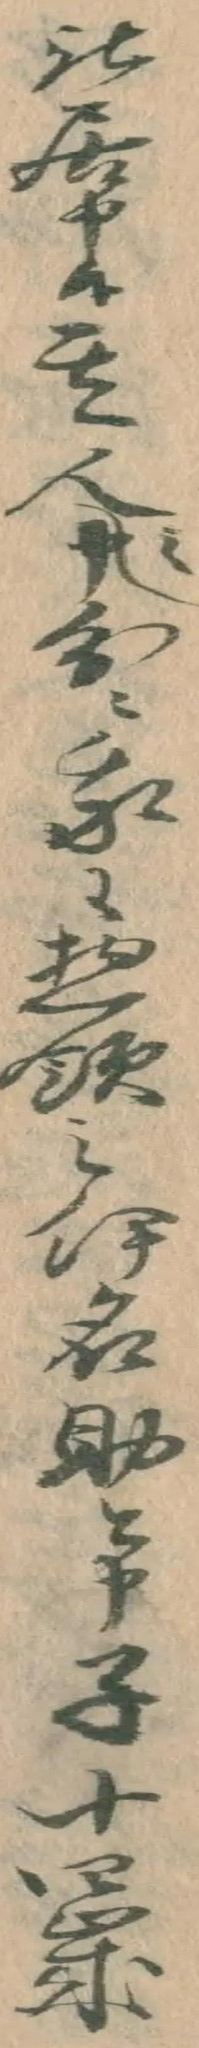被居申候其人之申分に我に惣領之伊名助と申子十四歳
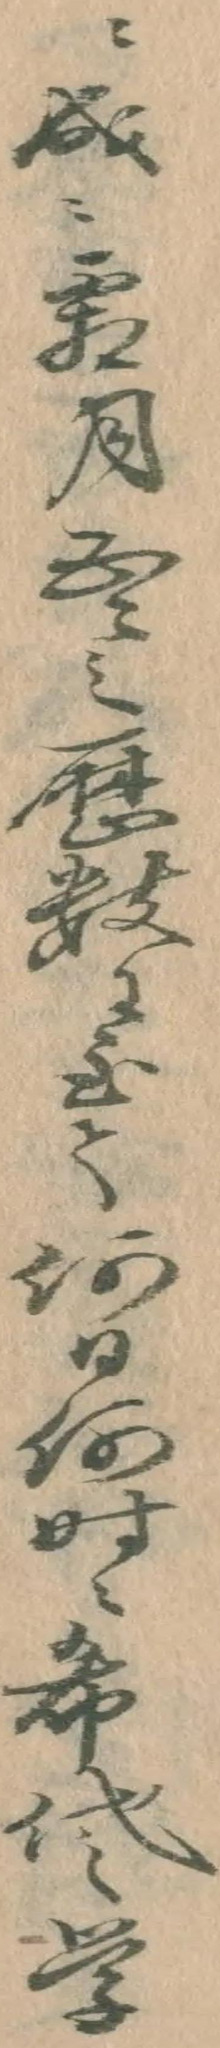に成に霜月五々之歴数に至て何日何時に希代之学
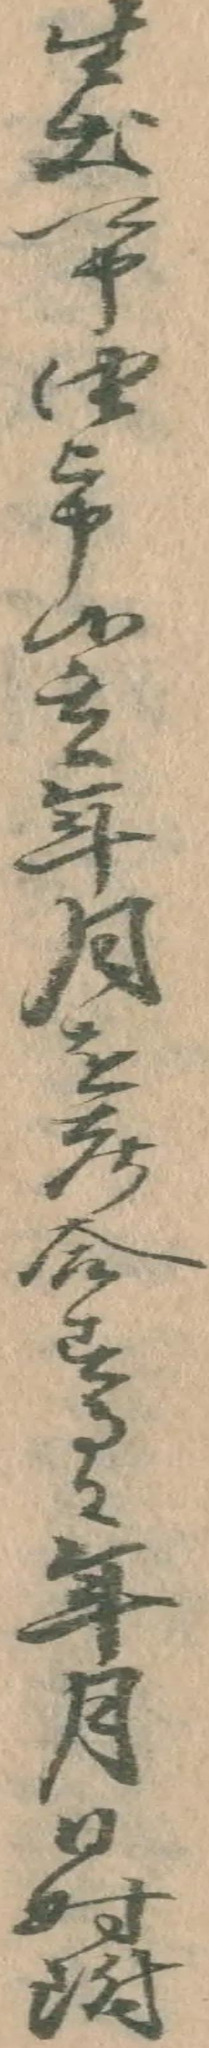生出可申由被申候其年月を考合するに年月日時附
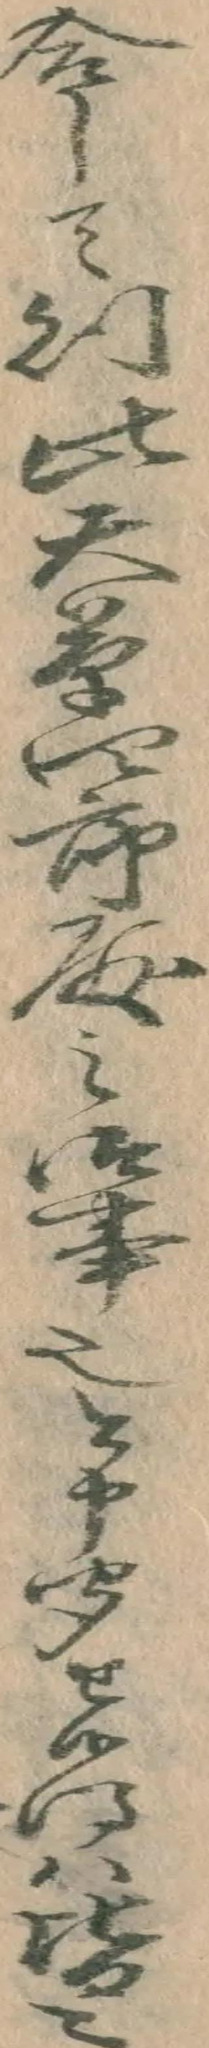合して則此天草四郎殿之御事也と申聞せ候得は皆々
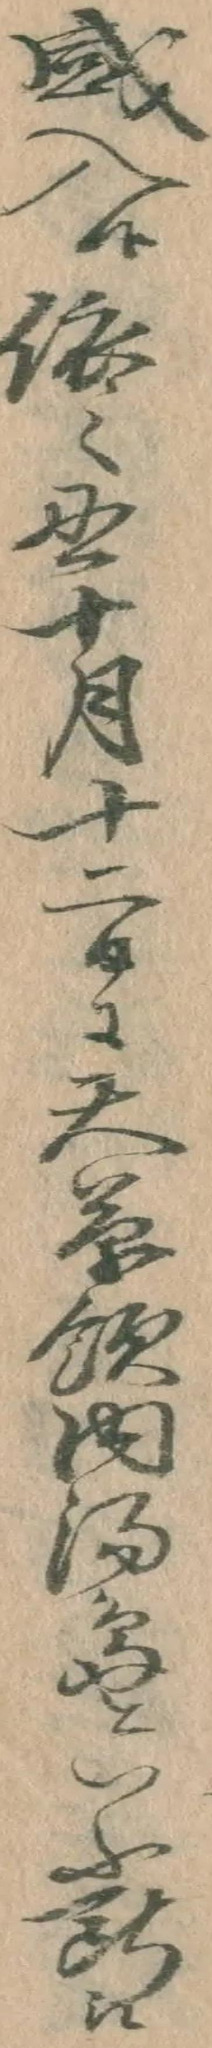感入候依之丑十月十二日に天草領内湯島といふ所え
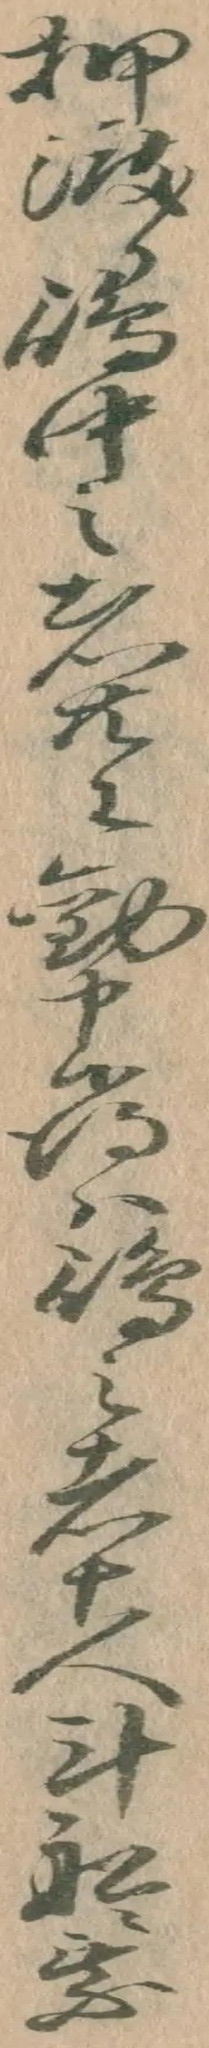押渡り島中之者共に勧申候得は島之者十人斗船に乗
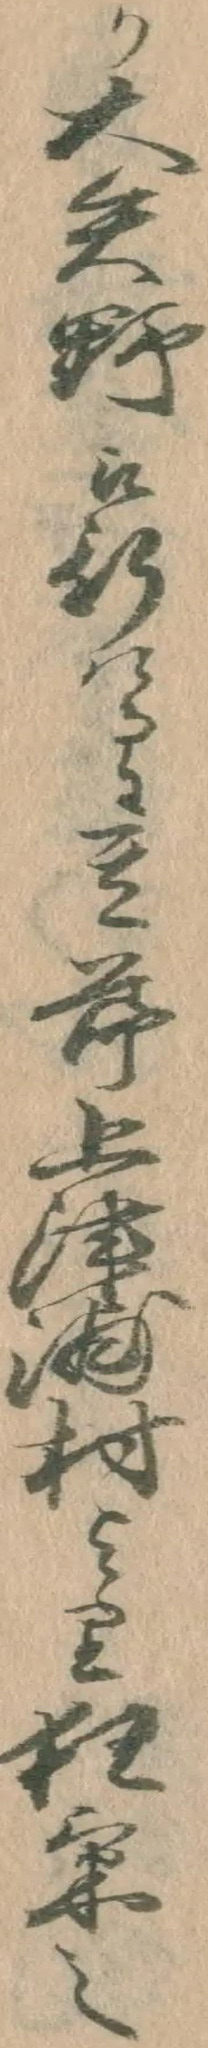り大矢野え行けるに其節上津浦村より狂気之
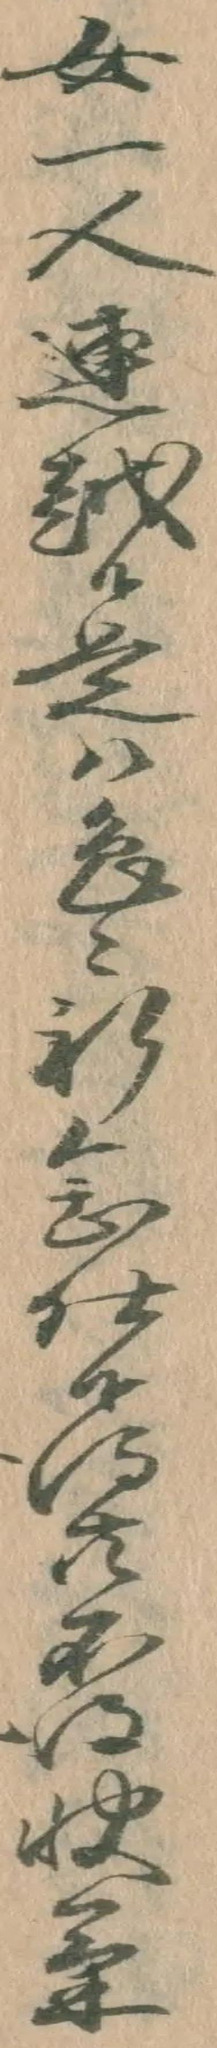女一人連越候是は色々祈念仕候得共不得快気
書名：切支丹御退治記 49巻. [1]
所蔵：国立国会図書館 National Diet Library, JAPAN
